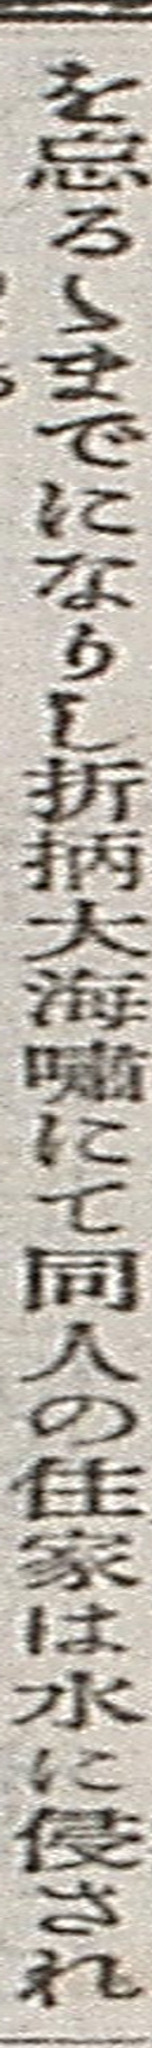を忘るゝまでになりし折柄大海嘯にて同人の住家は水に侵され
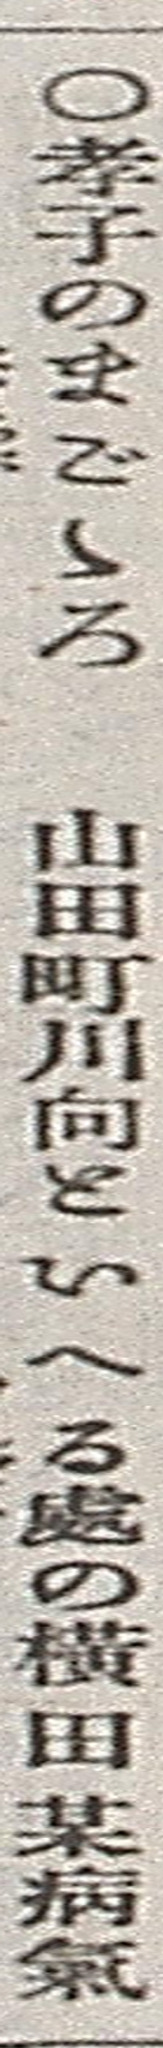○孝子のまごゝろ山田町川向といへる処の横田某病気
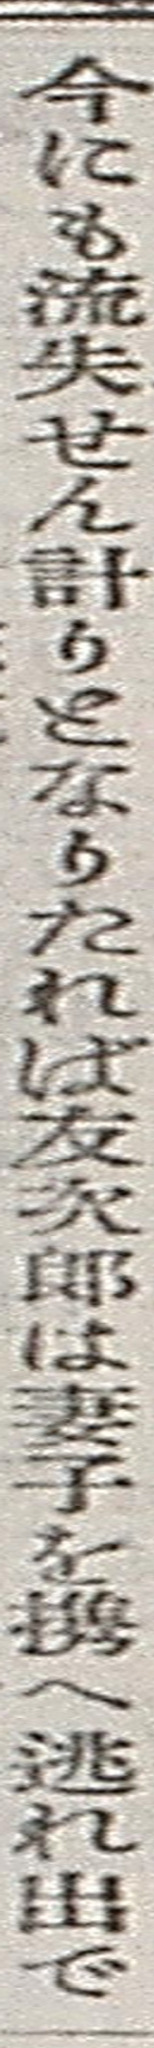今にも流失せん計りとなりたれば友次郎は妻子を携へ逃れ出で
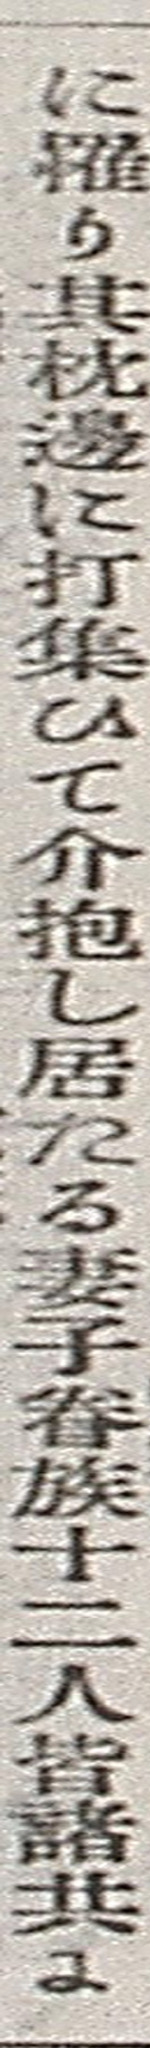に罹り其枕辺に打集ひて介抱し居たる妻子眷族十二人皆諸共に
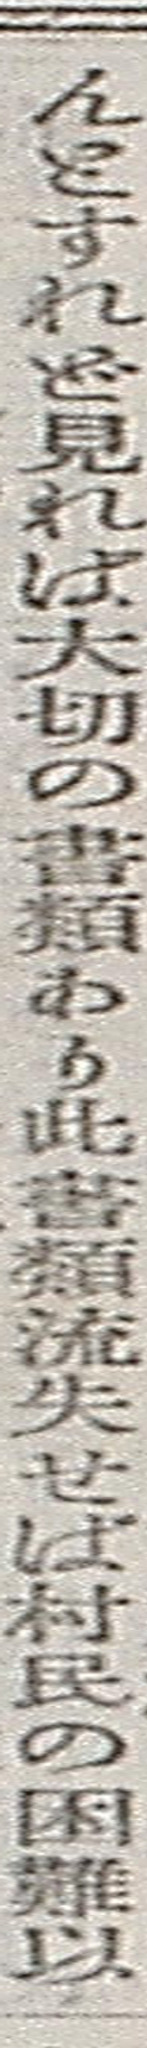んとすれど見れば大切の書類あり此書類流失せば村民の困難以
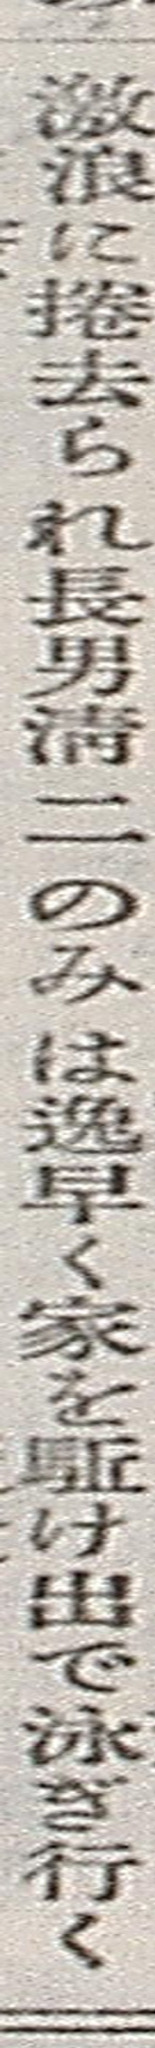激浪に捲去られ長男清二のみは逸早く家を駈け出で泳ぎ行く
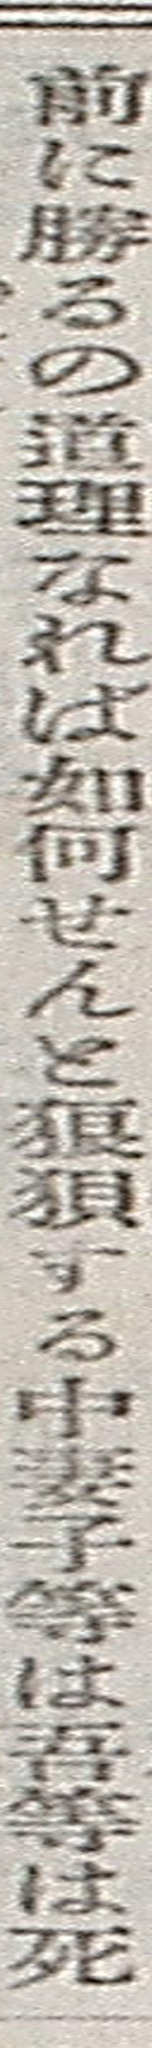前に勝るの道理なれば如何せんと狼狽する中妻子等は吾等は死
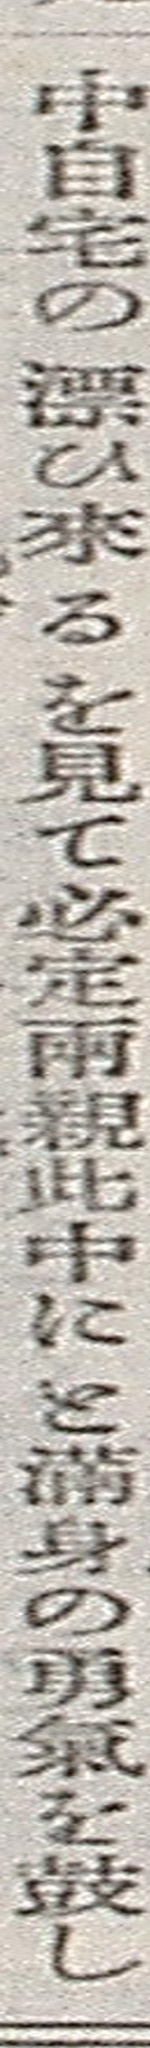中自宅の漂ひ来るを見て必定両親此中にと満身の勇気を鼓し
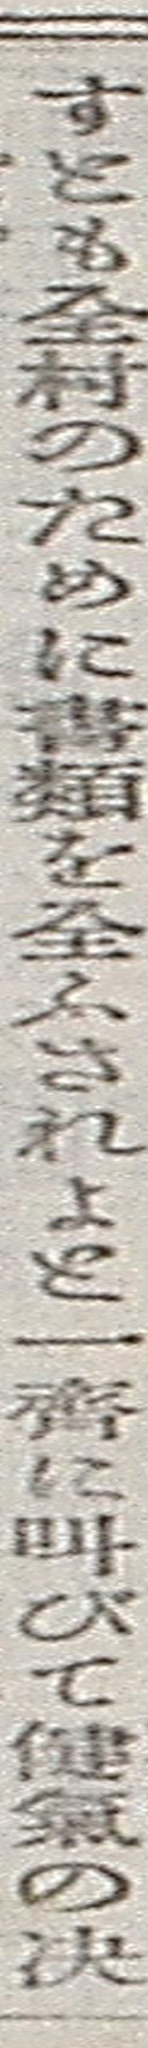すとも全村のために書類を全ふされよと一斉に叫びて健気の決
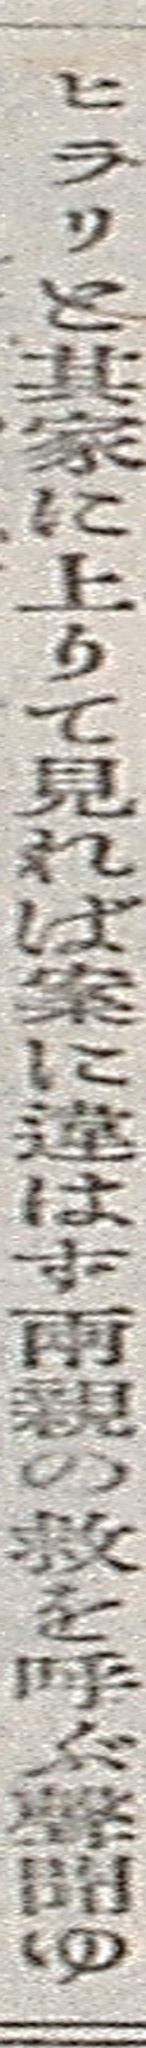ヒラリと其家に上りて見れば案に違はず両親の救を呼ぶ声聞ゆ
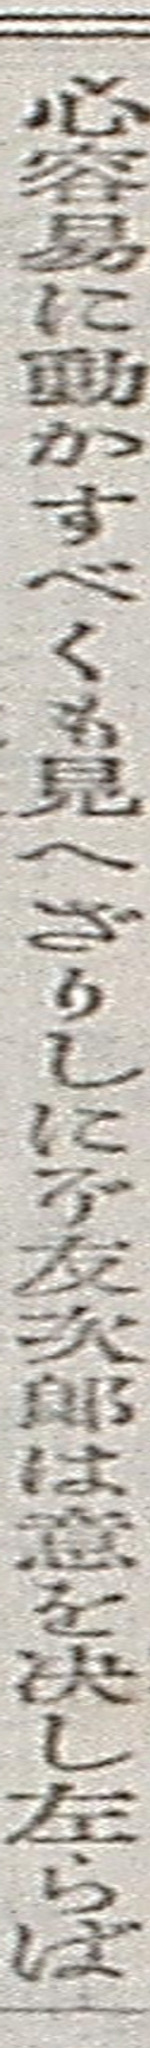心容易に動かすべくも見へざりしにぞ友次郎は意を決して左らば
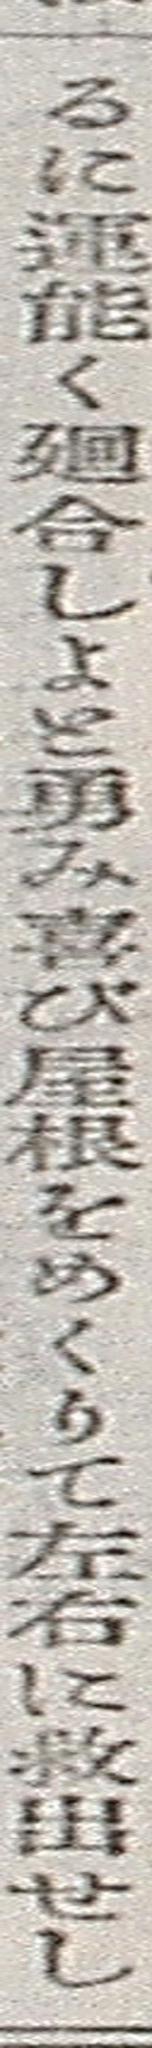るに運能く廻合しよと勇み喜び屋根をめくりて左右に救出せし
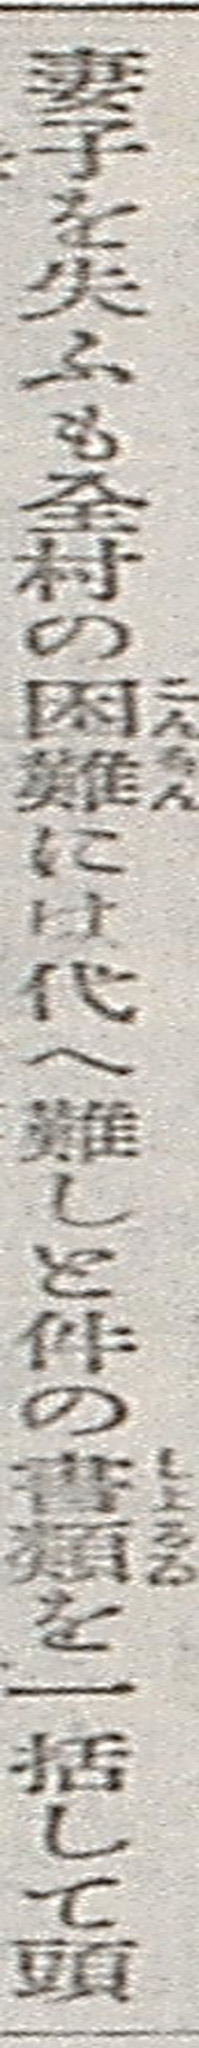妻子を失ふも全村の困難には代へ難しと件の書類を一括して頭
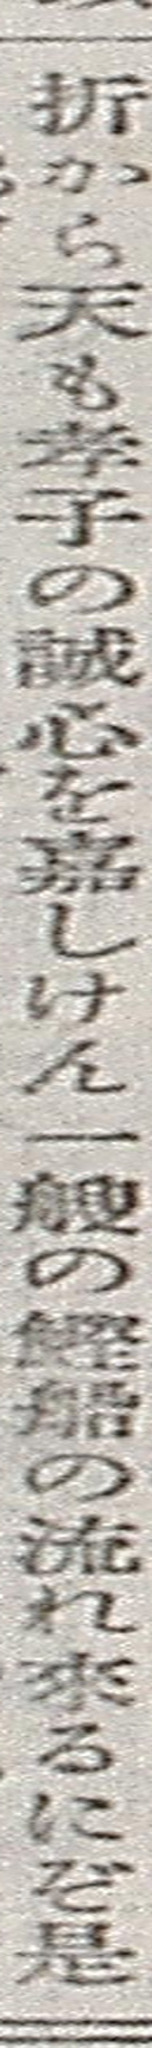折から天も孝子の誠心を嘉しけん一艘の鰹船の流れ来るにぞ是
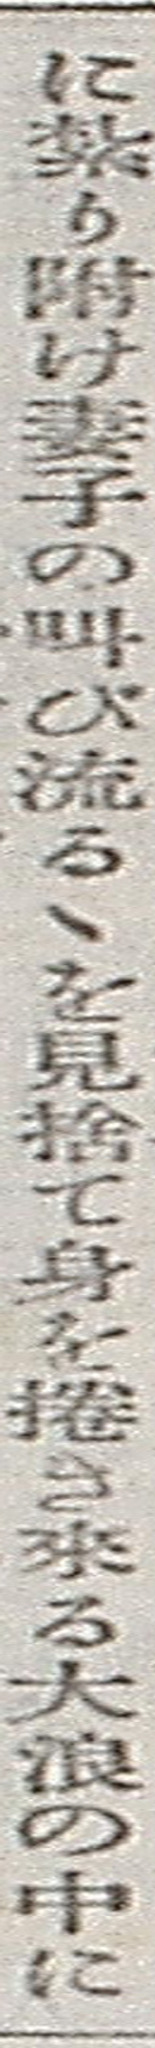に紮り付け妻子の叫び流るゝを見捨て身を捲き来る大浪の中に
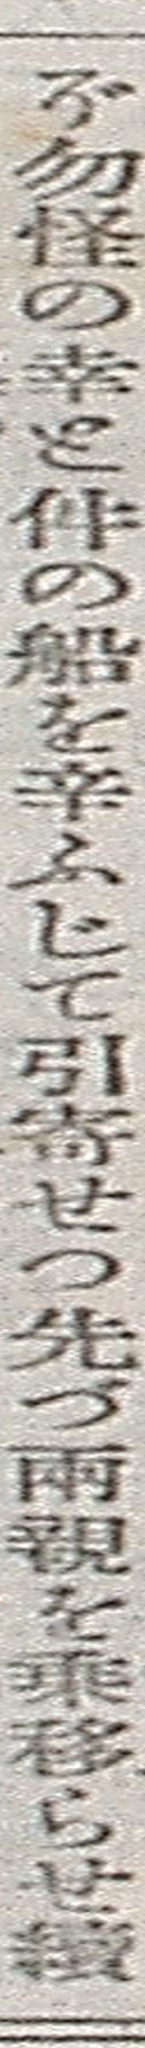ぞ勿怪の幸と件の船を辛ふじて引寄せつ先づ両親を乗移らせ続
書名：風俗畫報臨時増刊第百二十號　大海嘯被害録（下）
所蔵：東京大学地震研究所図書室 Earthquake Research Institute Library, The University of Tokyo, JAPAN
